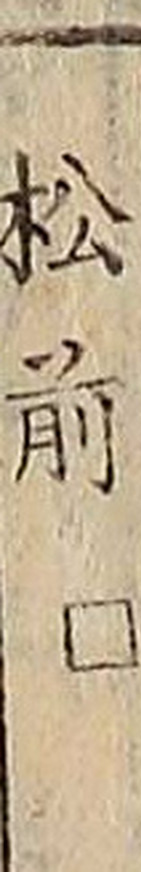松前▫
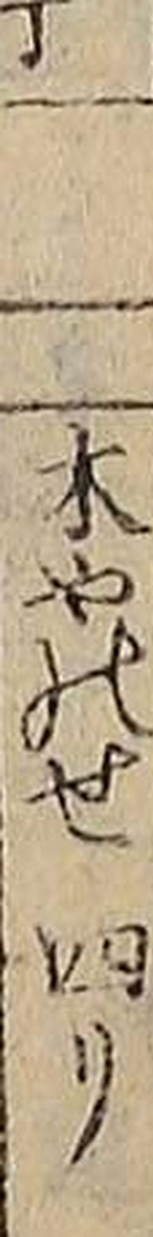木やのせ四リ
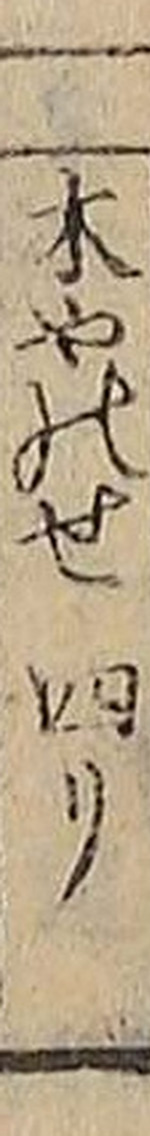木やのせ四リ
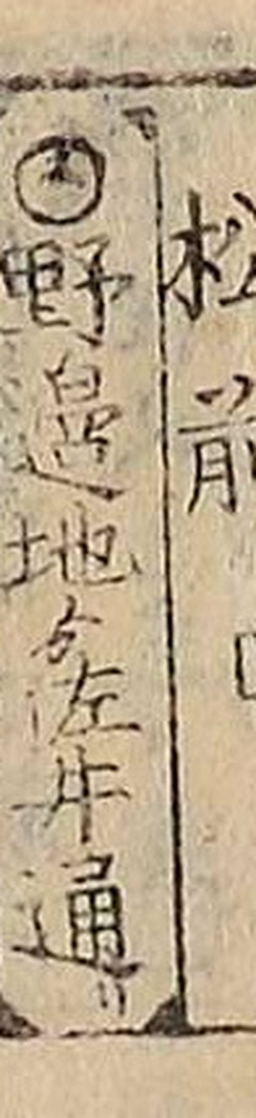○野辺地ゟ佐井通
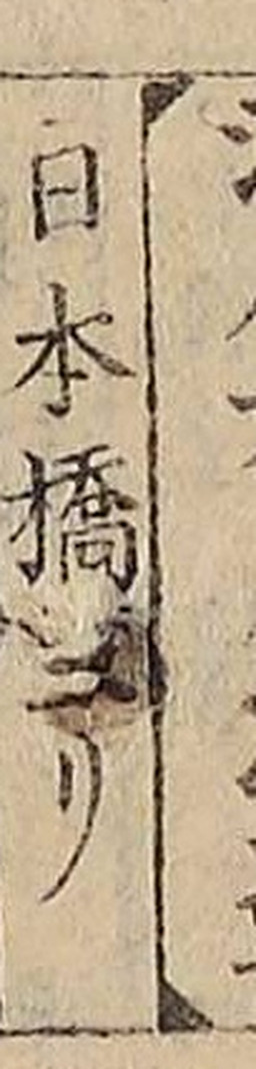日本橋二り
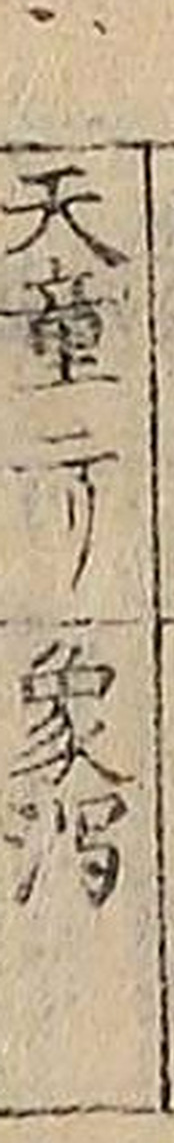天童二リ象潟
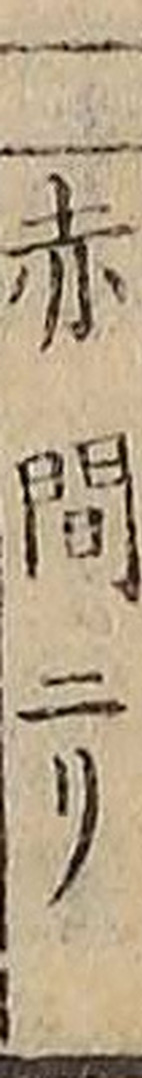赤間二リ
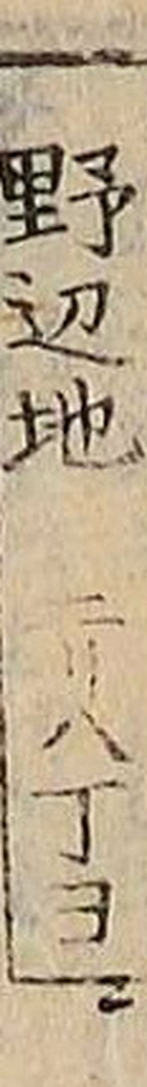野辺地二リ八丁ヨ
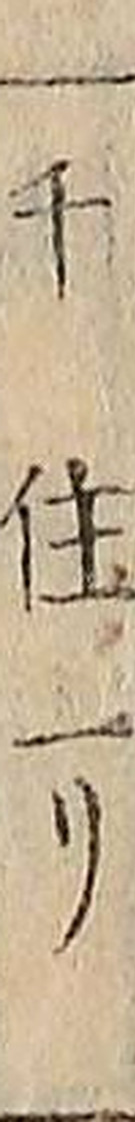千住一リ
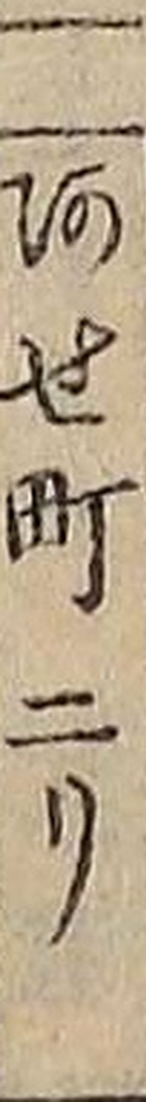あせ町二リ
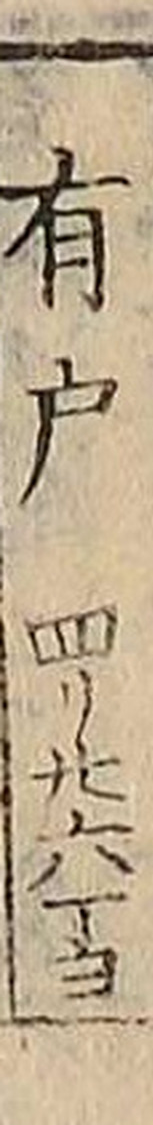有戸四リ廿六丁ヨ
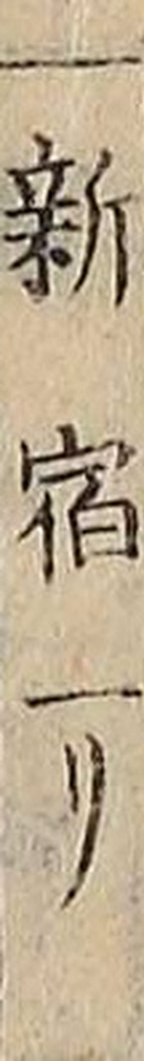新宿一リ
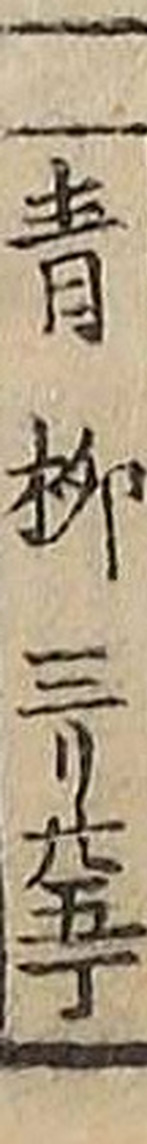青柳三リ廿五丁
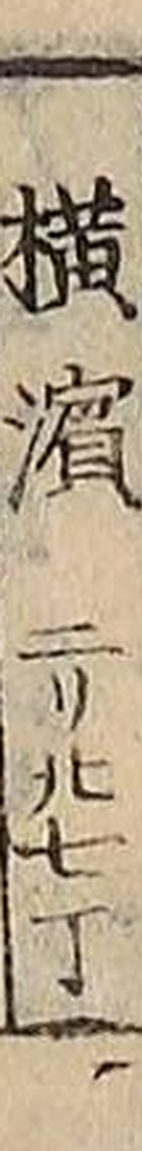横浜二リ廿七丁
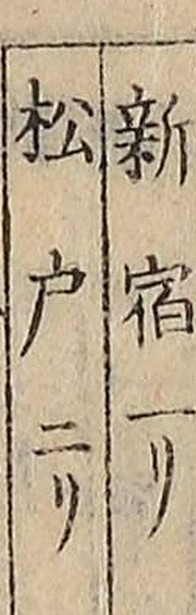新宿一リ
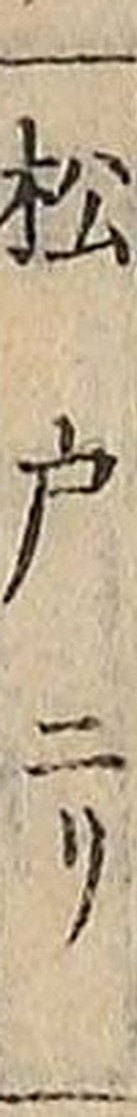松戸二リ
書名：旅行用心集
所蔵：神戸大学附属図書館 国文学研究資料館
